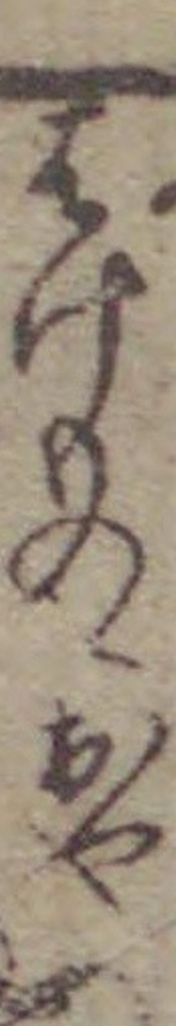はけものゝおや
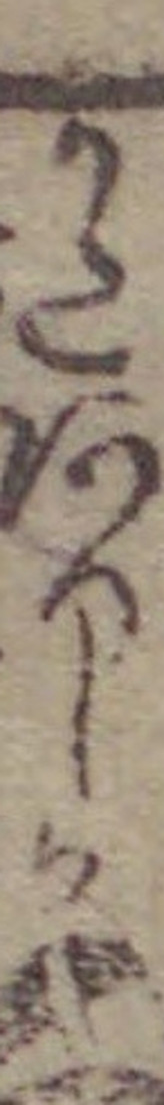かたありしか
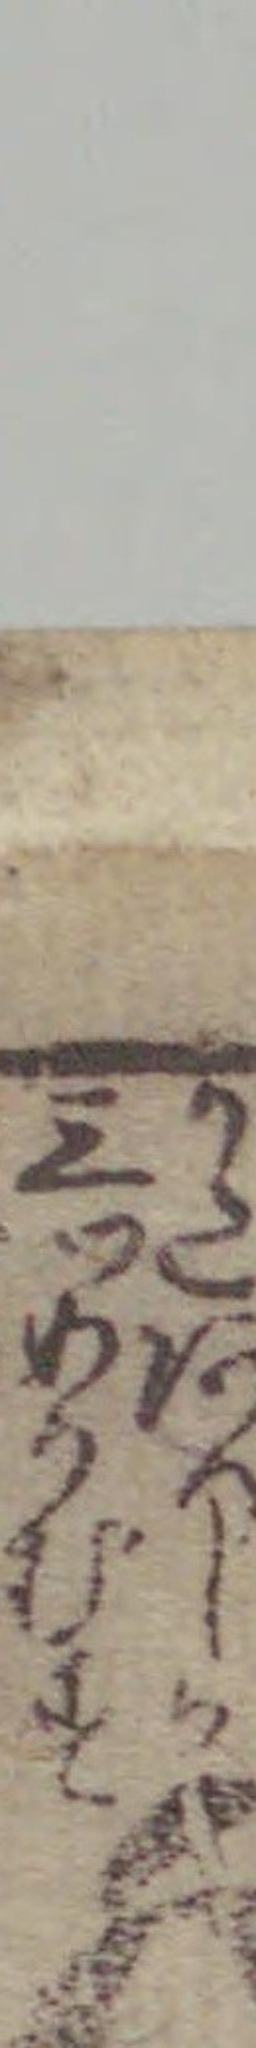三ツめかむす
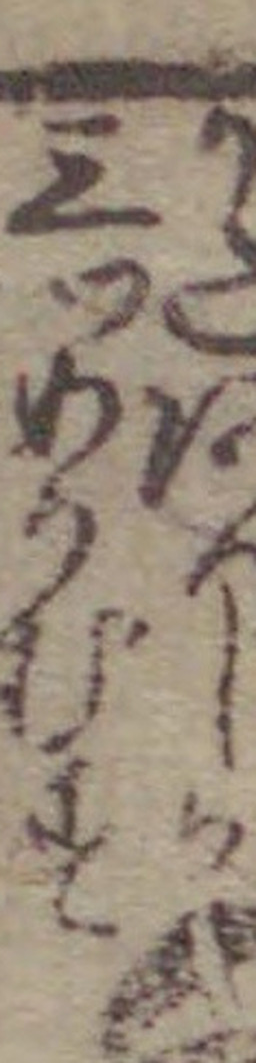三ツめかむす

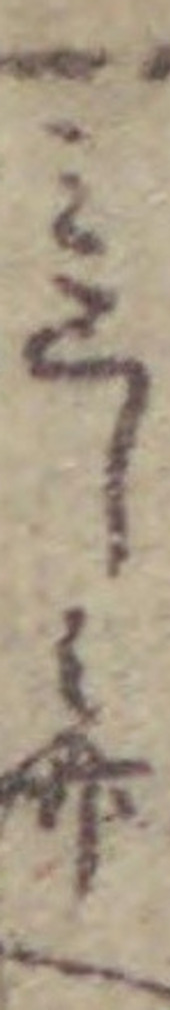みこし之介
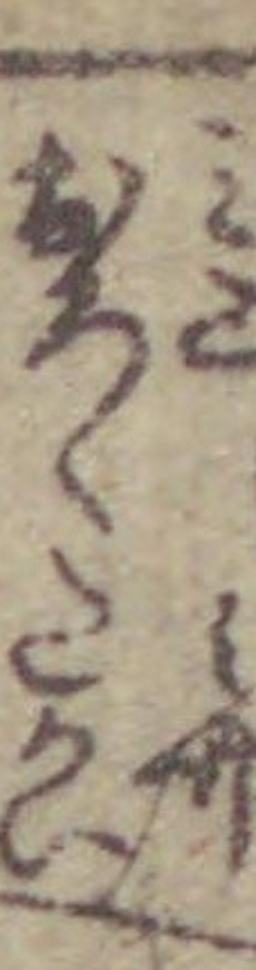おろくたかいに
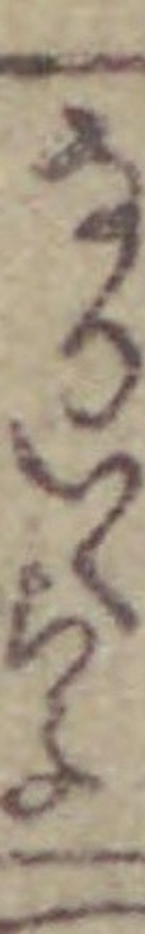なりいくちよ
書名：妖相生の盃 2巻
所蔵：国立国会図書館 National Diet Library, JAPAN
